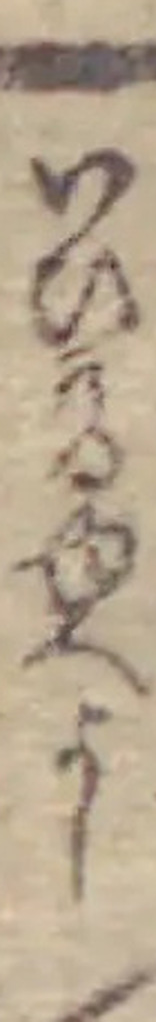いひけるゆへよし
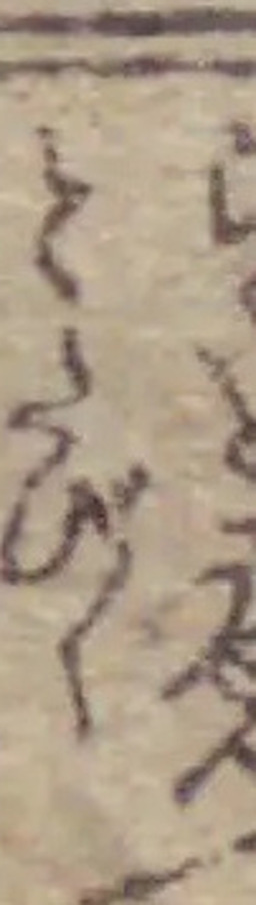とたび〳〵
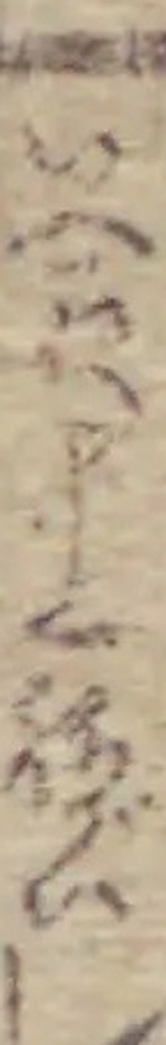いへ公へ申上ねがい
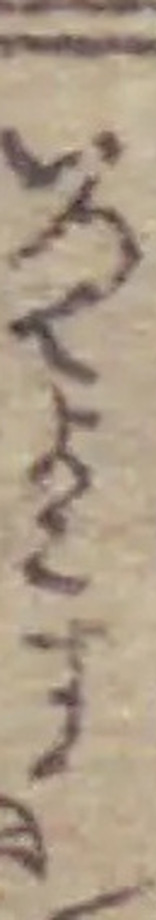いつてよこす
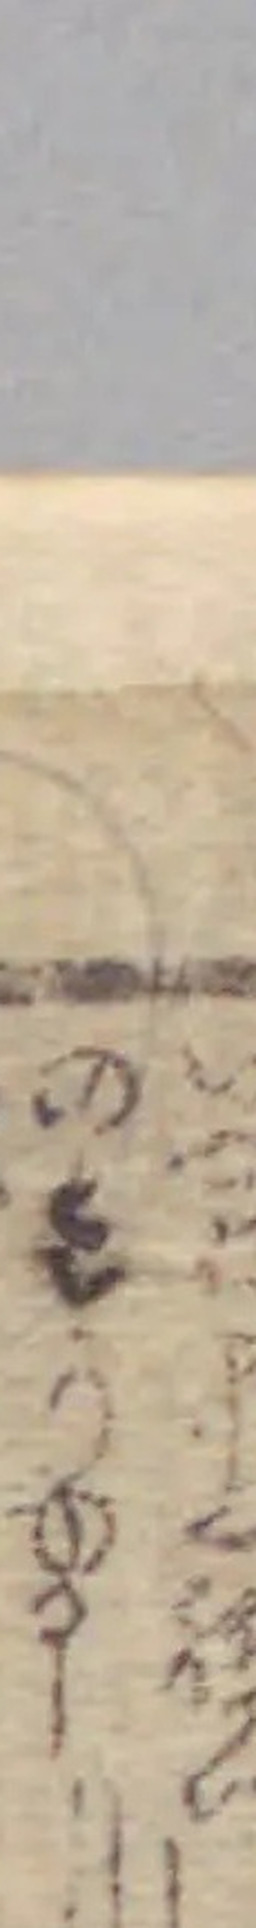のりゆるし
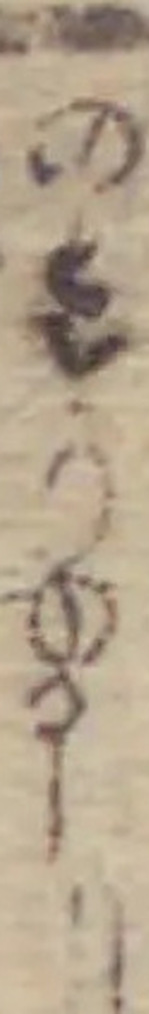のりゆるし
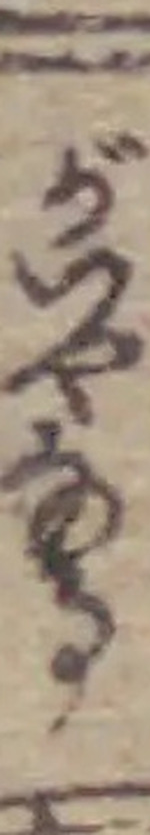がいやな事
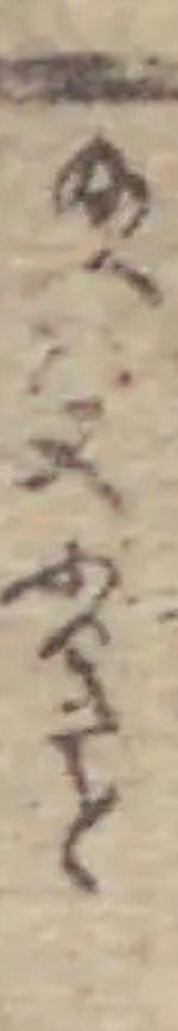給へば又ふるさと
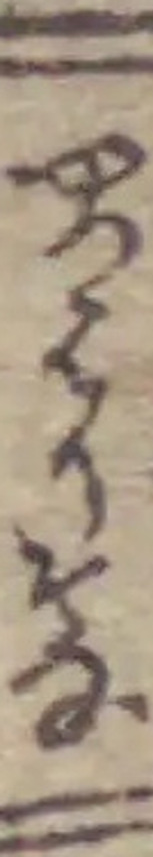やつはりそな
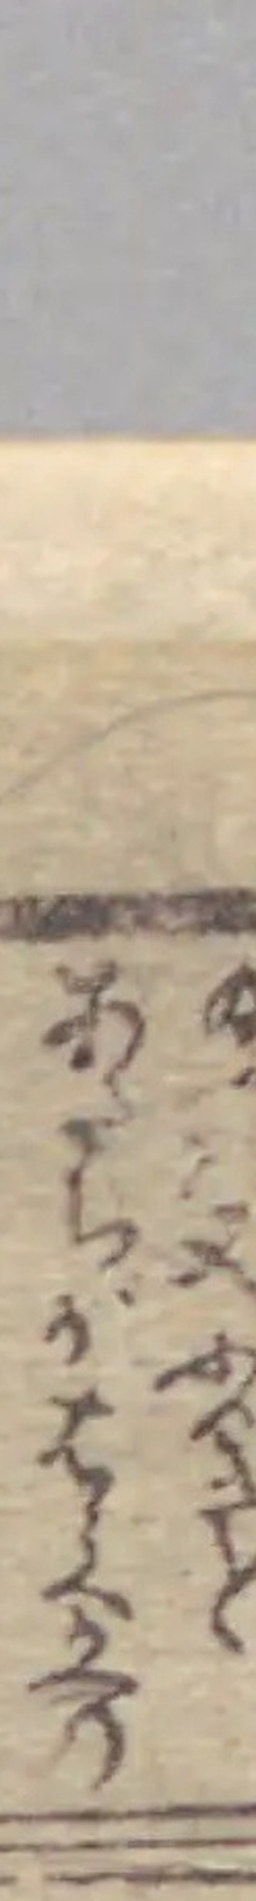あたちかはらへかへり
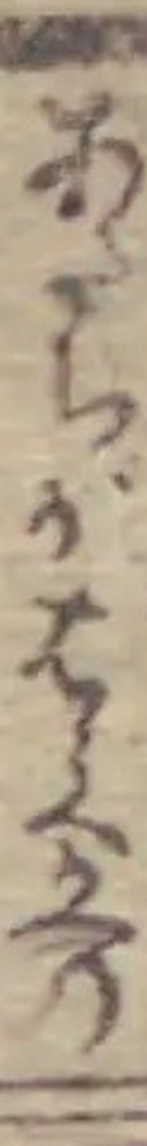あたちかはらへかへり
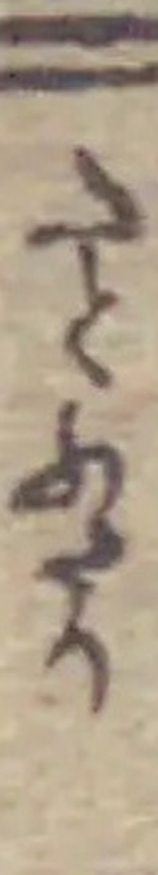たとふたり
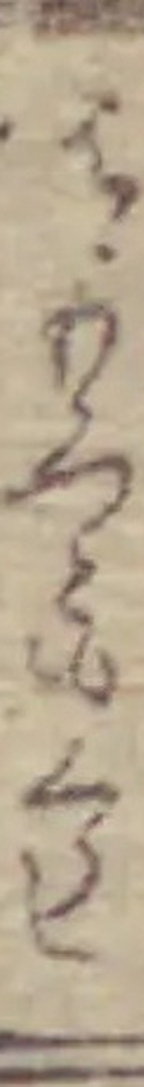はゝもらつともくらし
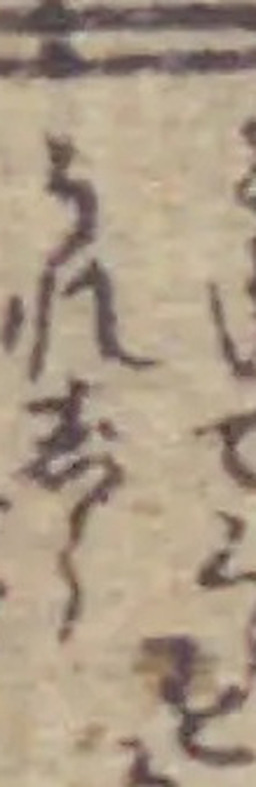うれしう
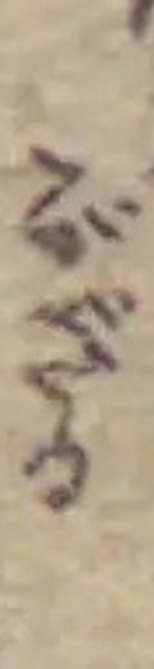ござる
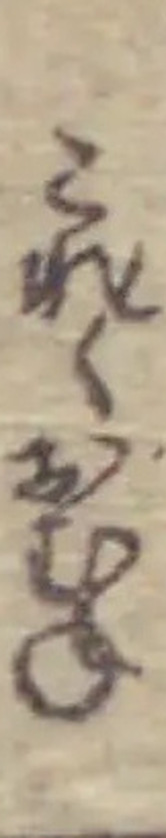これ〳〵おむね
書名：奥州咄 3巻
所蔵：国立国会図書館 National Diet Library, JAPAN
